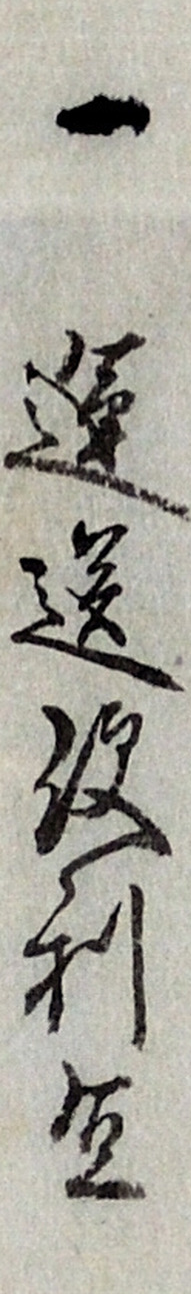一運送便利宜
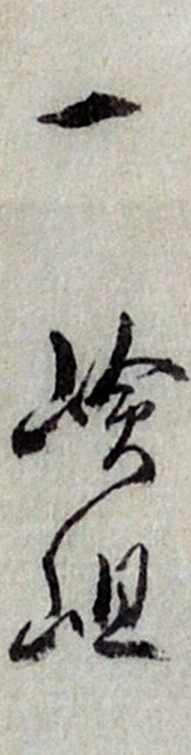一嶮岨
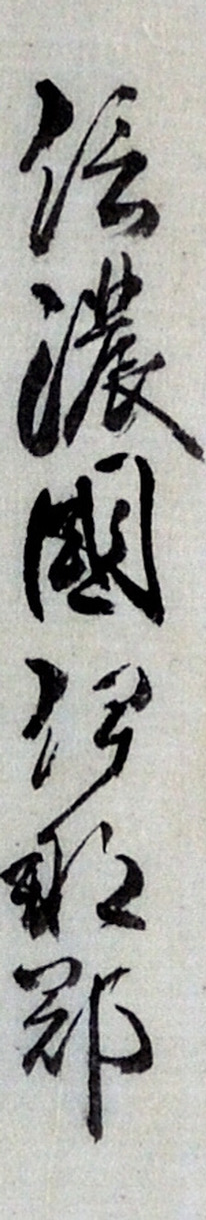信濃国伊那郡
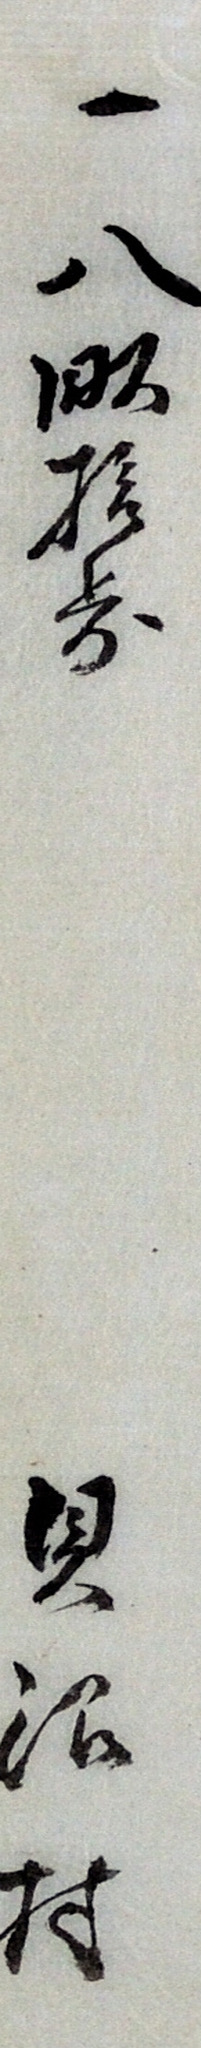一八㽗拾歩貝沼村
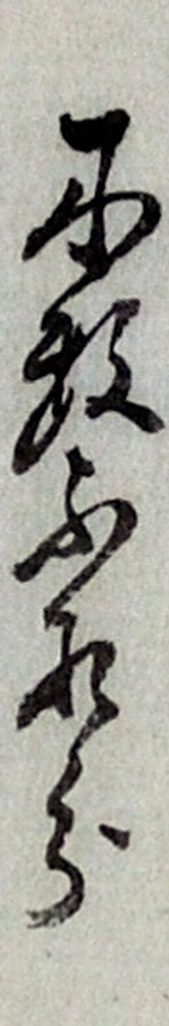木数不相分
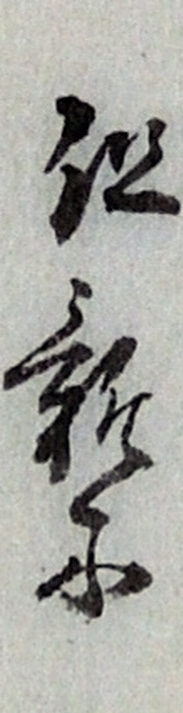但雑木
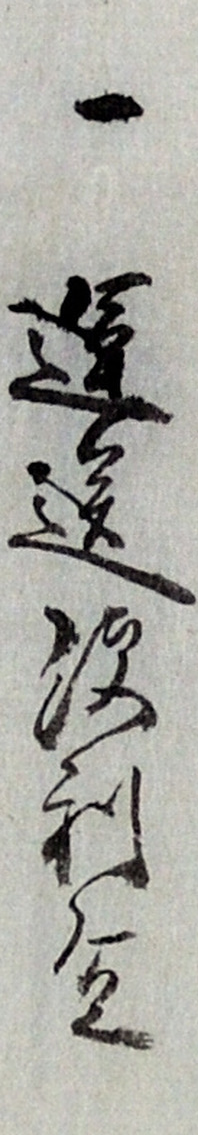一運送便利宜

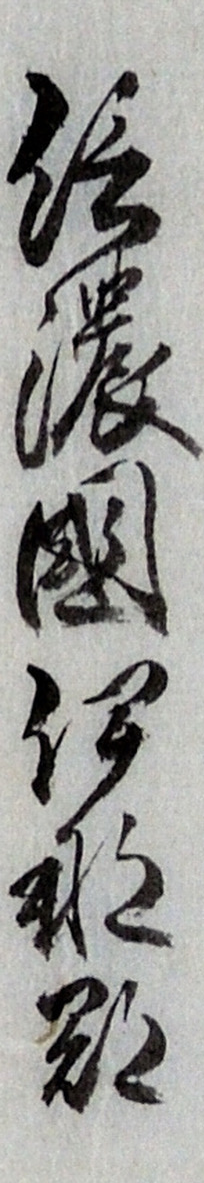信濃国伊那郡
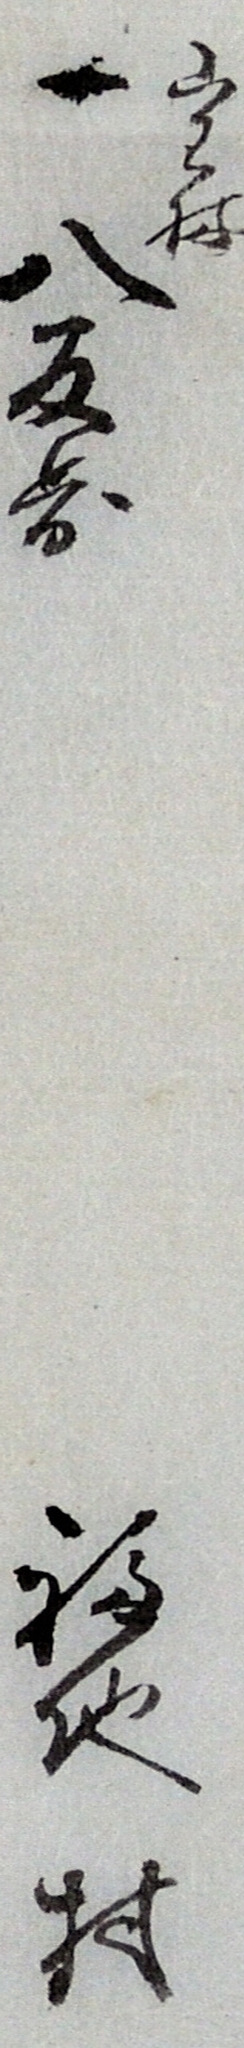一八反歩福地村
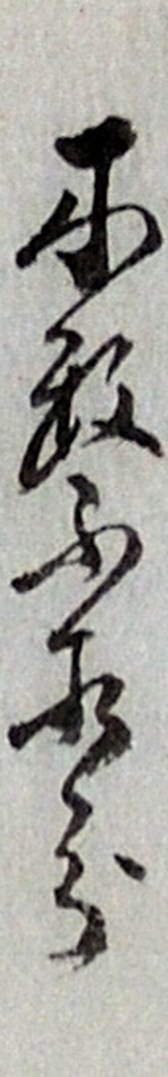木数不相分
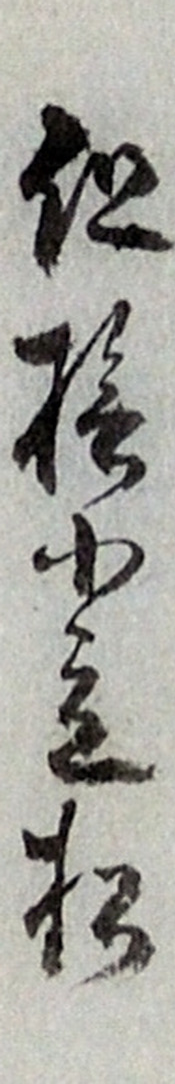但桧小立松
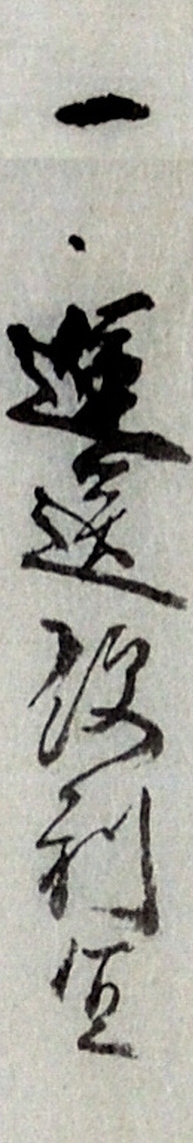一運送便利宜
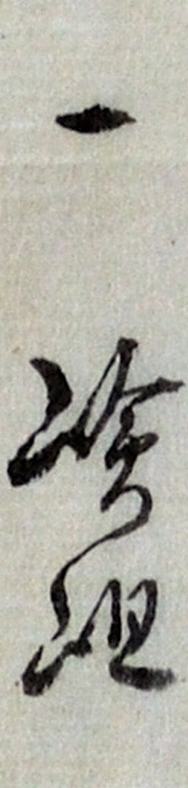一嶮岨
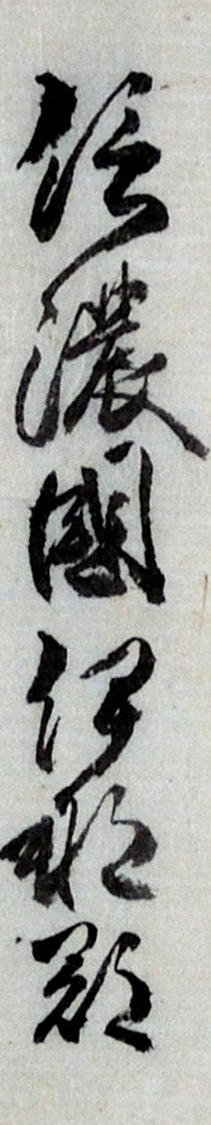信濃国伊那郡
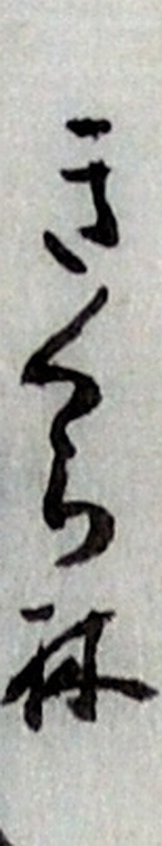きくら林
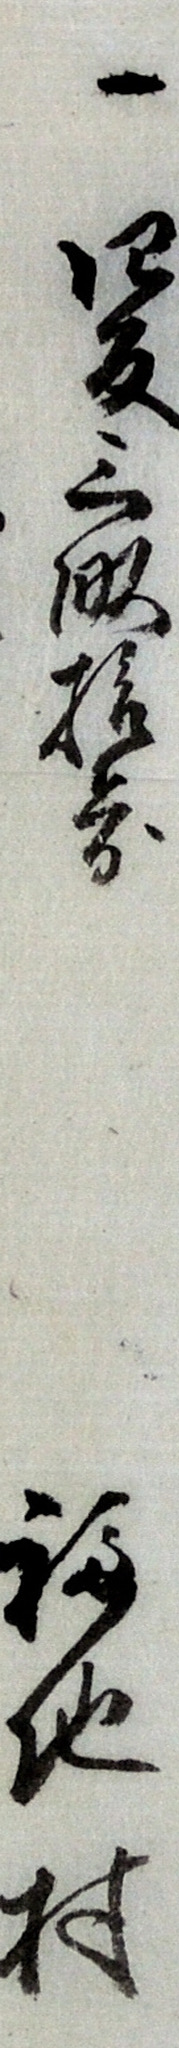一四反三㽗拾歩福地村
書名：官林反別帳
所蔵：伊那市立高遠町図書館・合同会社AMANE
